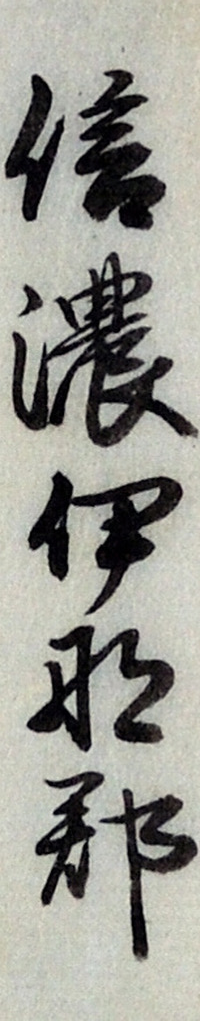信濃伊那郡
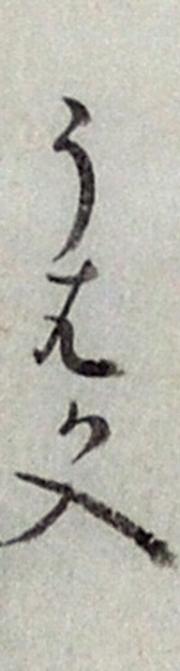うはか入
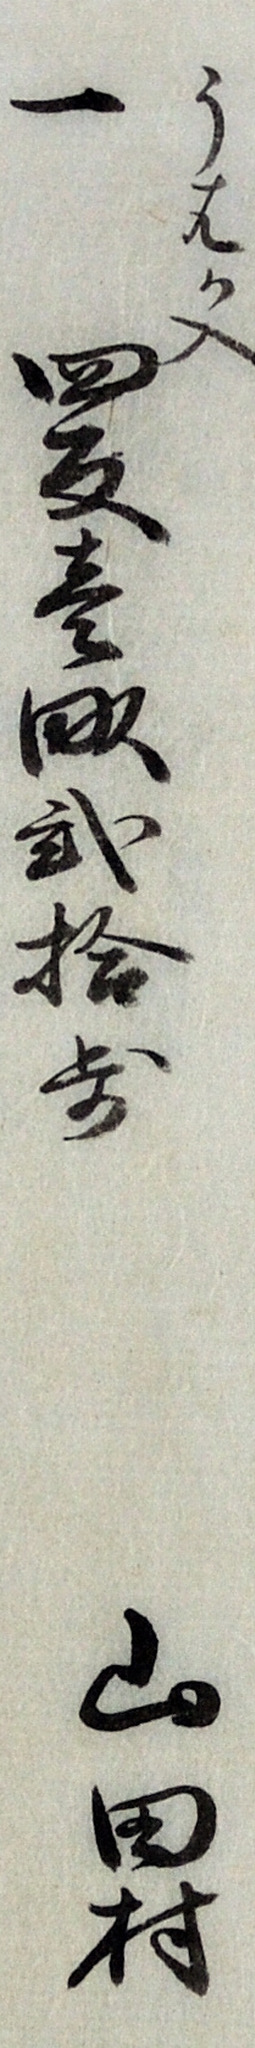一四反六㽗弐拾歩山田村
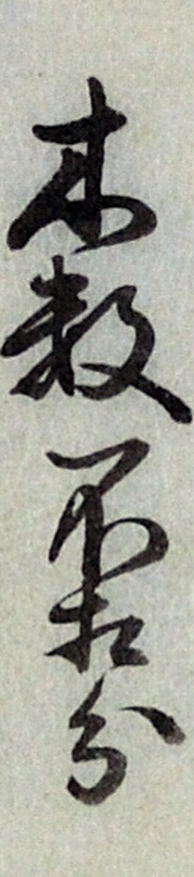木数不相分
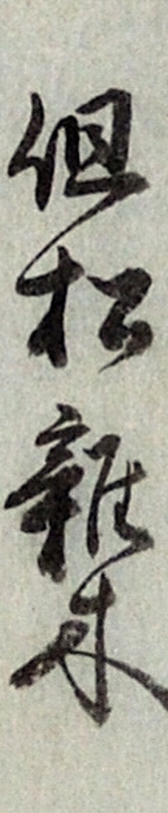但松雑木
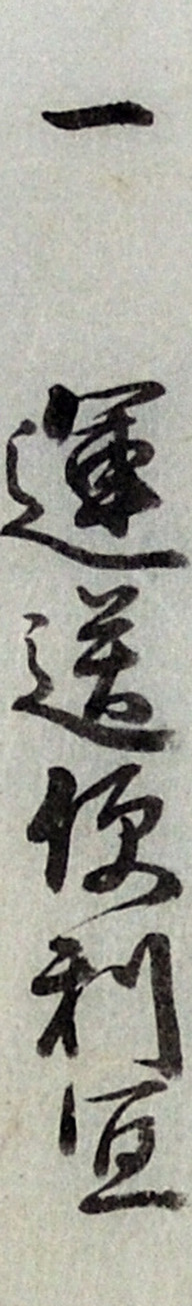一運送便利宜
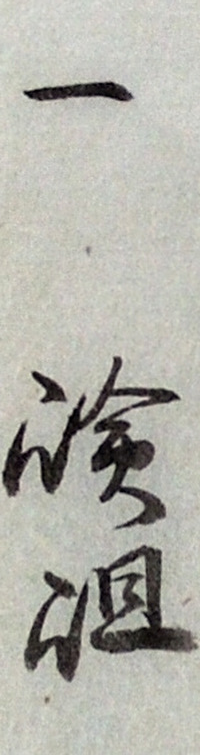一嶮岨

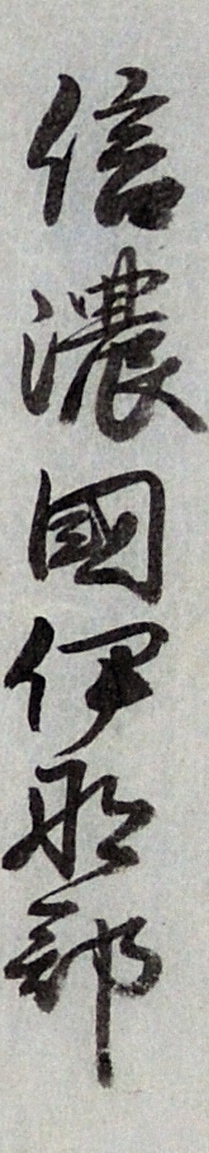信濃国伊那郡
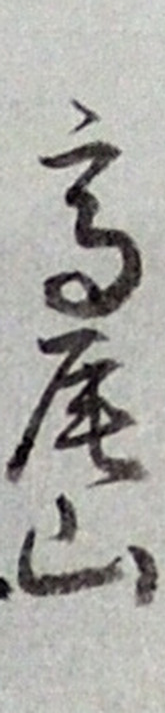高尾山
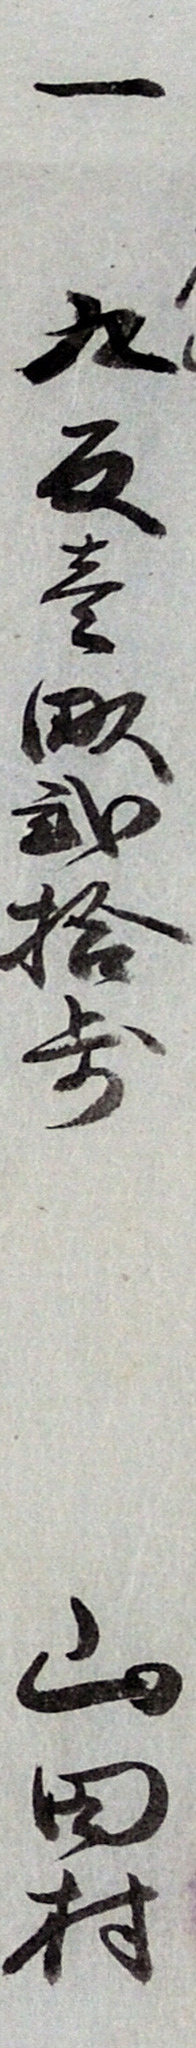一九反壱㽗弐拾歩山田村
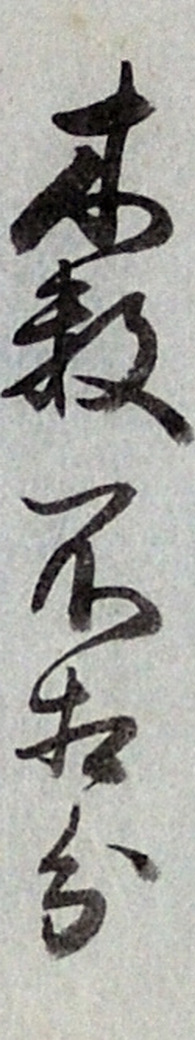木数不相分
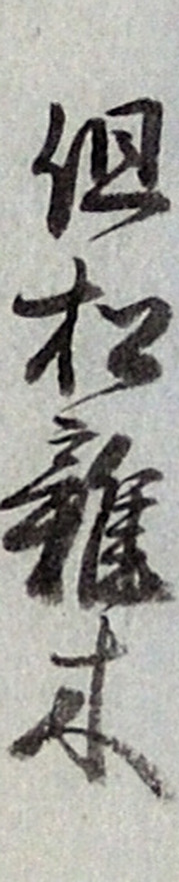但松雑木
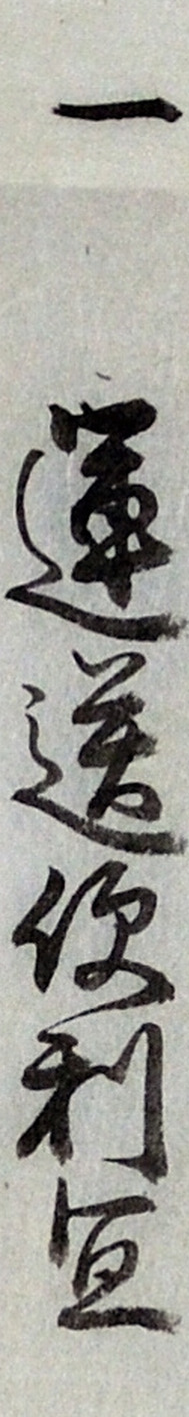一運送便利宜
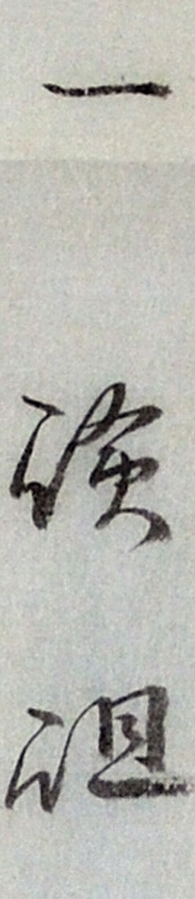一嶮岨
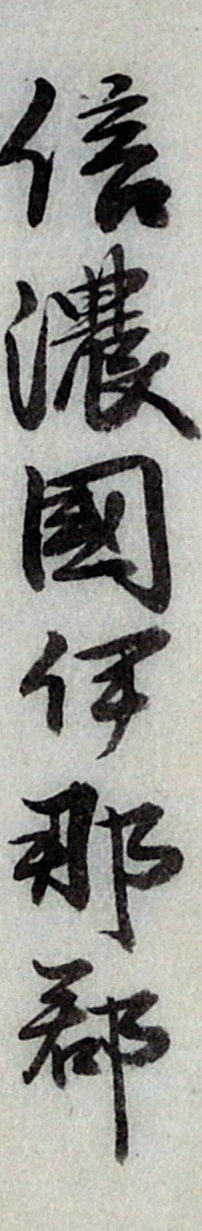信濃国伊那郡
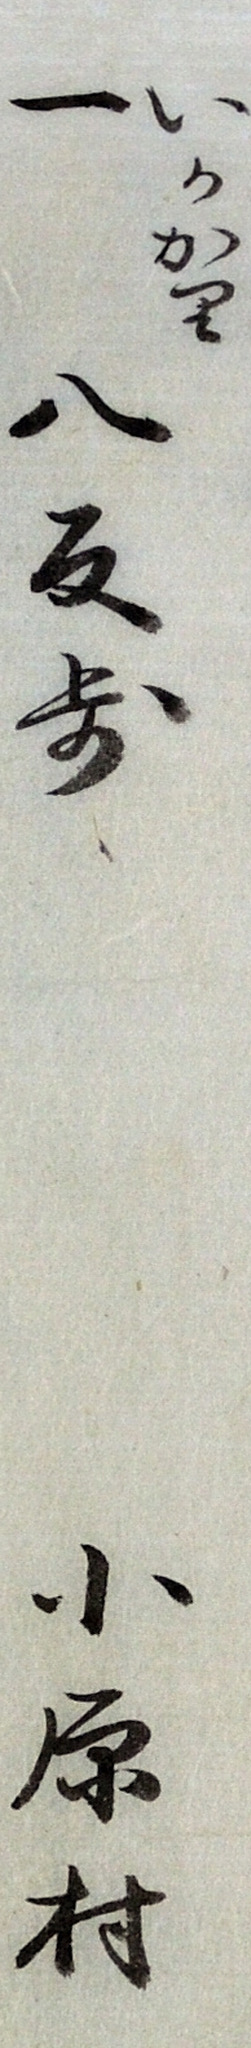一八反歩小原村
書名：官林反別帳
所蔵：伊那市立高遠町図書館・合同会社AMANE
